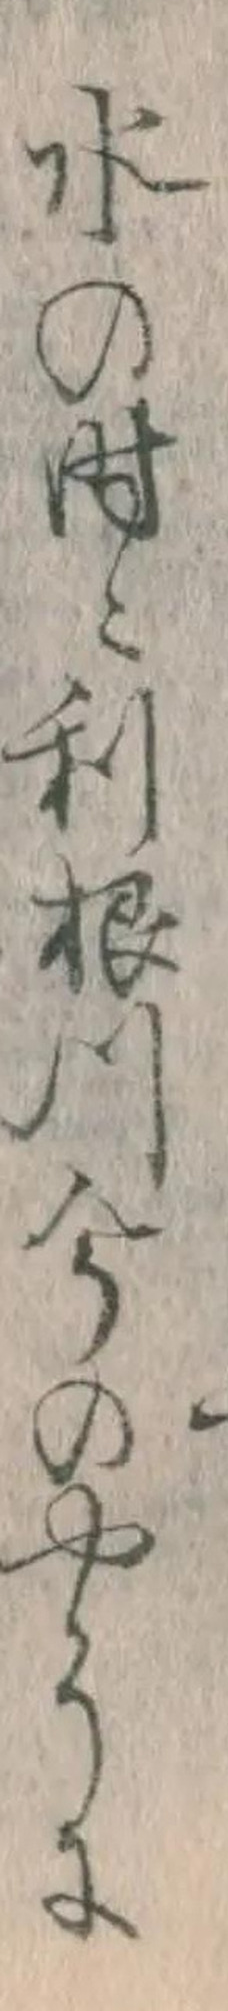水の時々利根川今のやうに
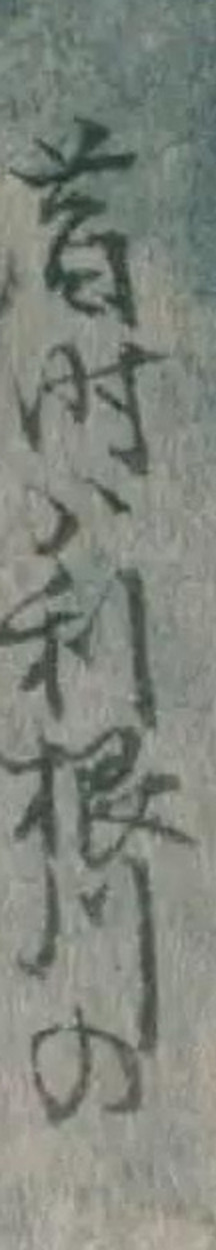昔時は利根川の
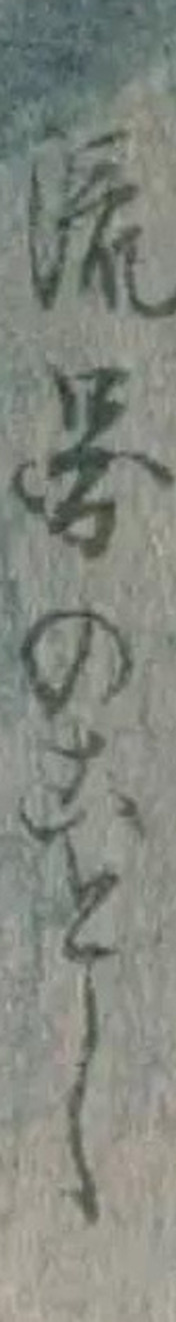流図のことし
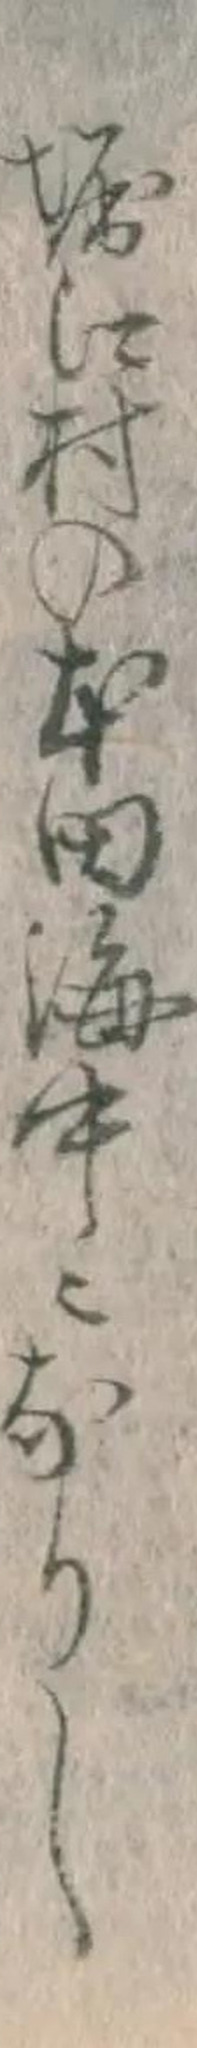堀江村の本田海中になりし
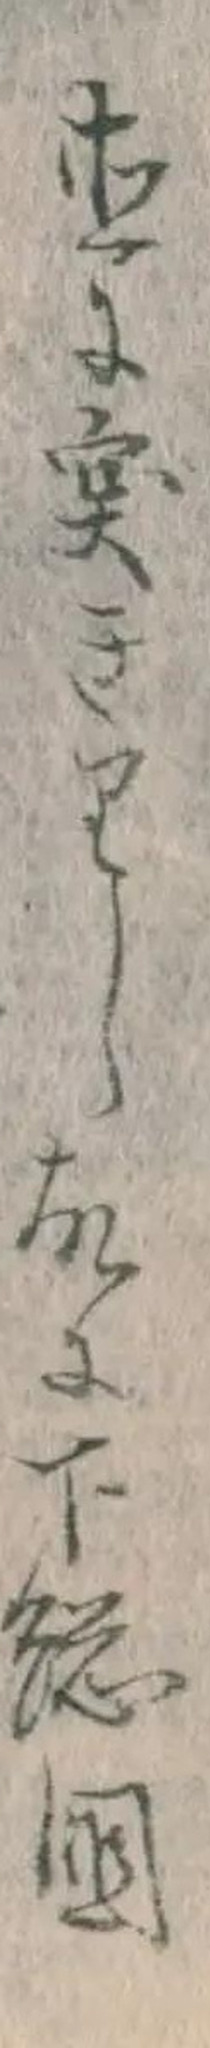直に突きりし故に下総国
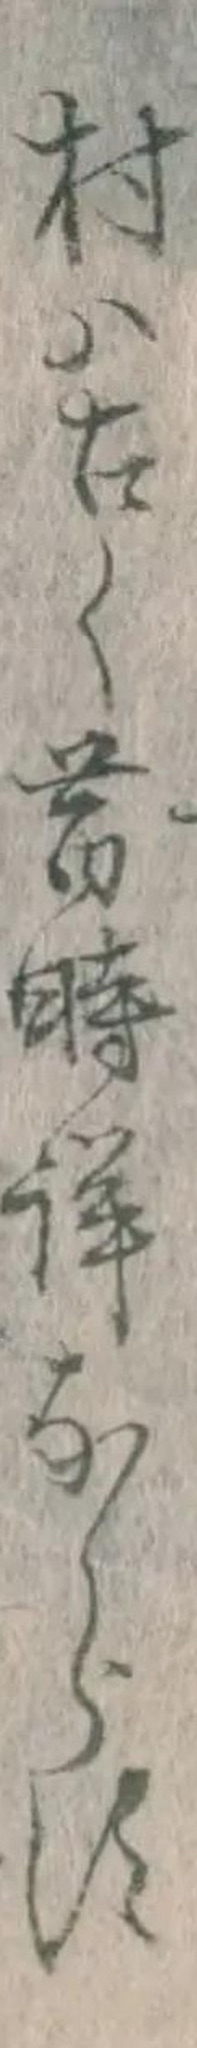村は古く昔時詳ならす
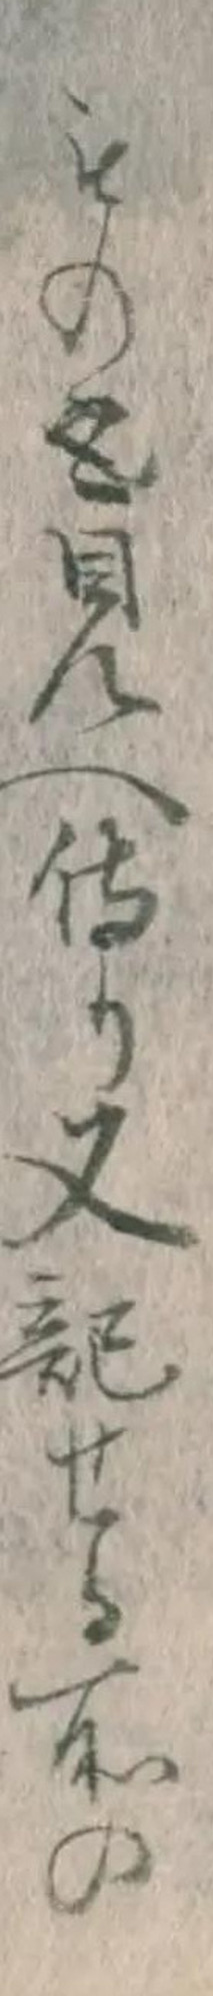ものと見へ侍り又記せる所の
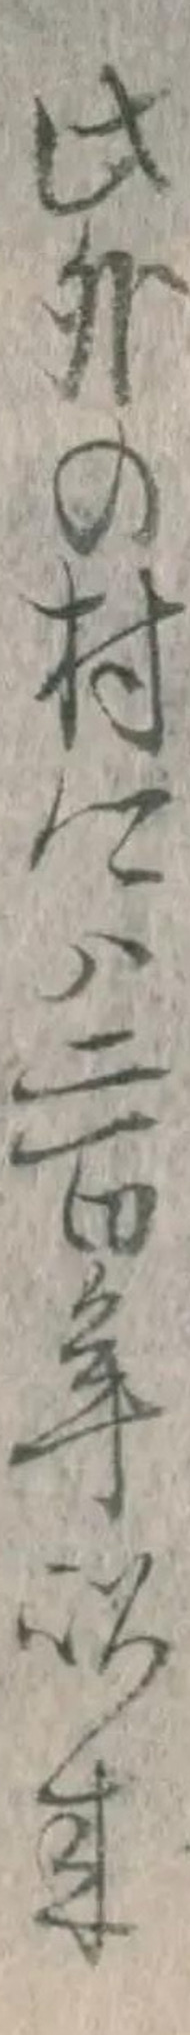此外の村郷は二百年以来
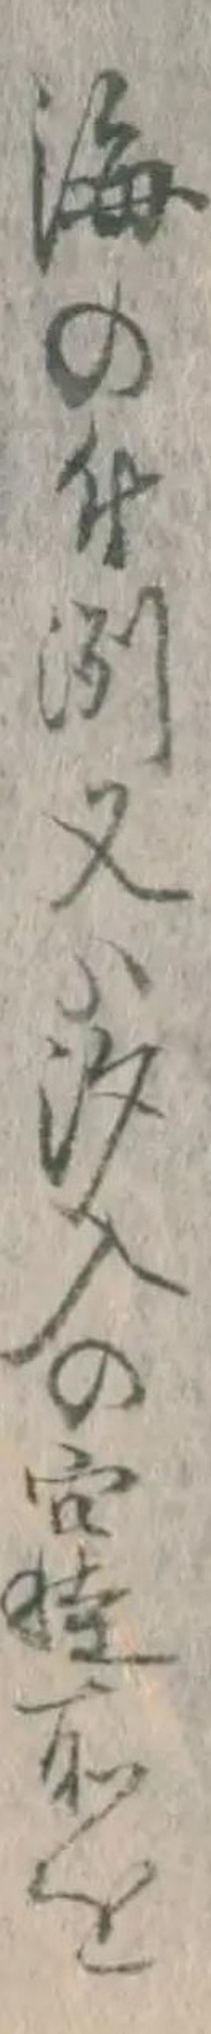海の付州又は汐入の窪所を
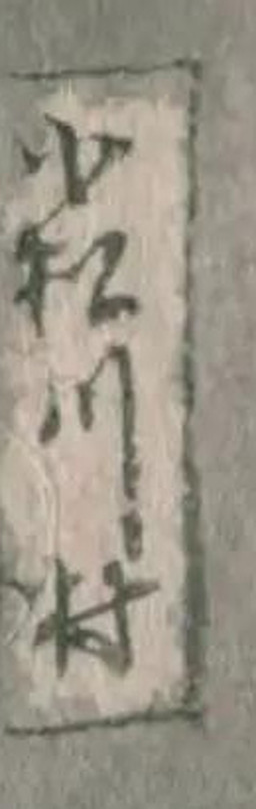小松川村
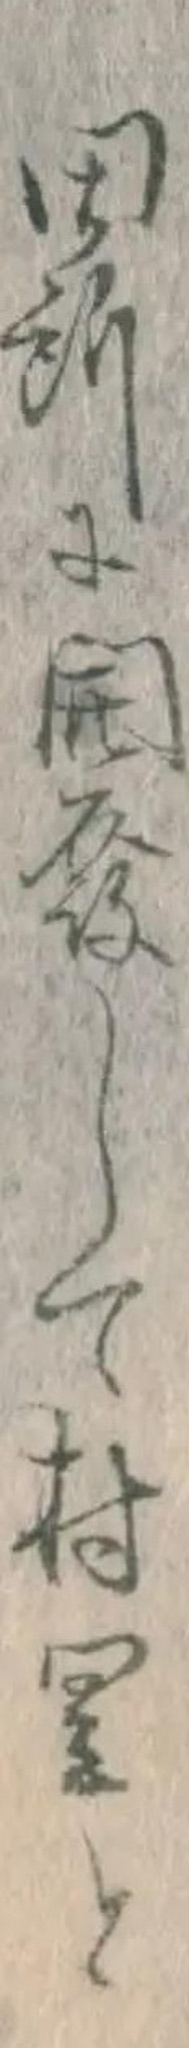田所に開発して村里と
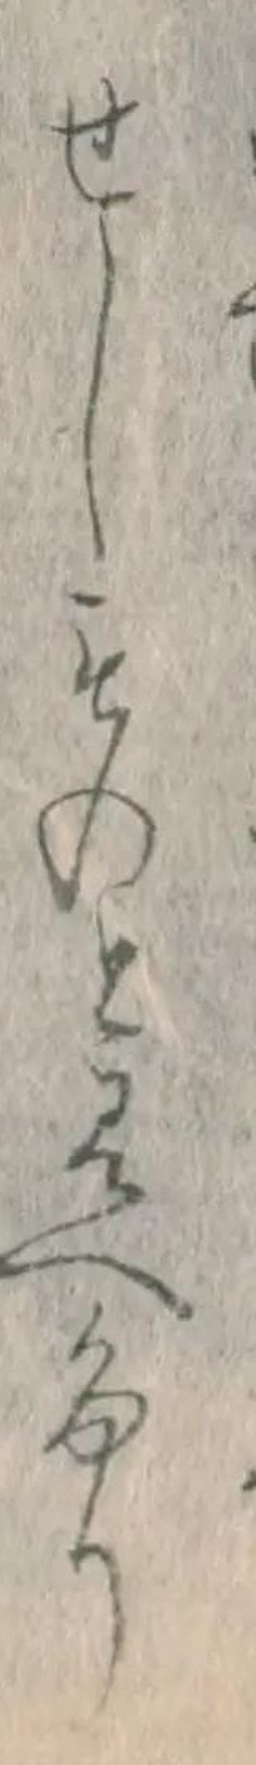せしものと見へたり

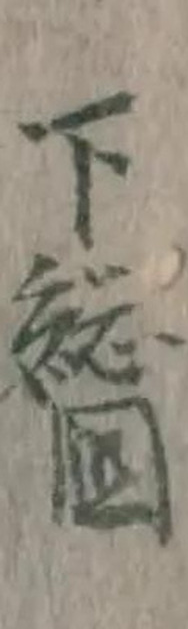下総国
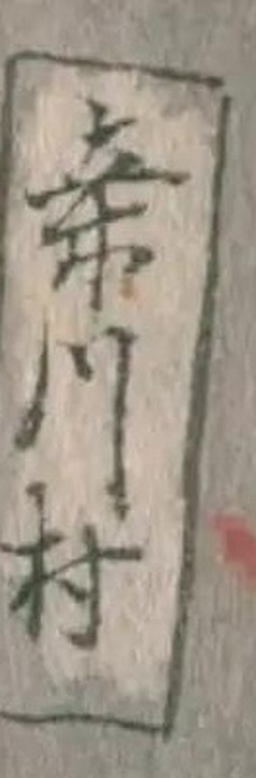桑川村
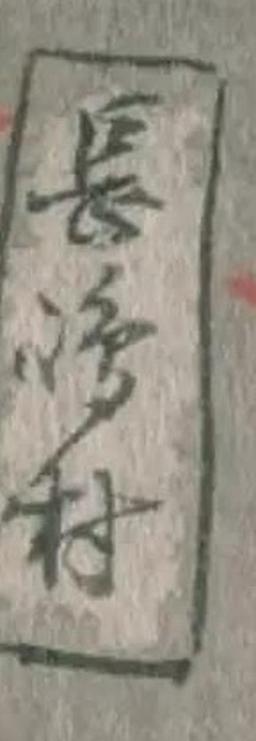長島村
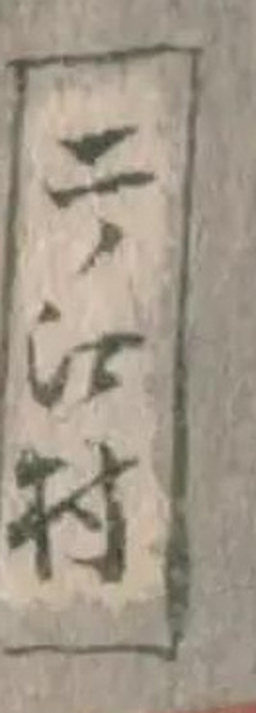二ノ江村
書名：四神地名録 6巻. [4]葛飾郡
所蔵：国立国会図書館 National Diet Library, JAPAN
